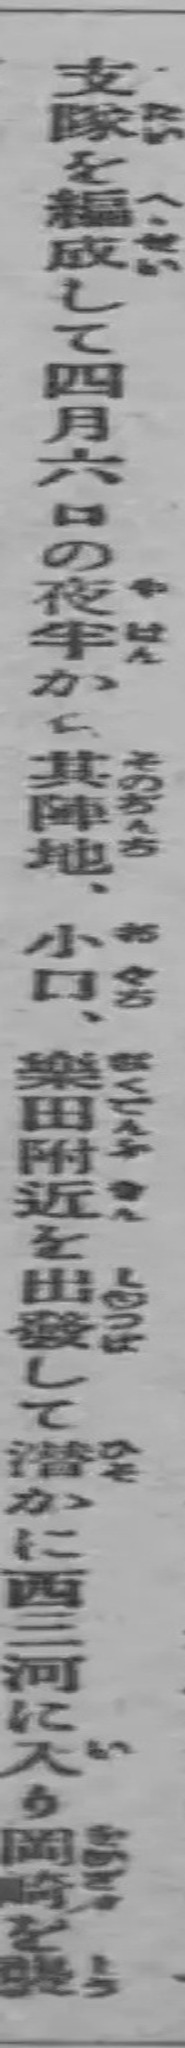支隊を編成して四月六日の夜半から其陣地、小口、楽田附近を出発して潜かに西三河に入り岡崎を撃
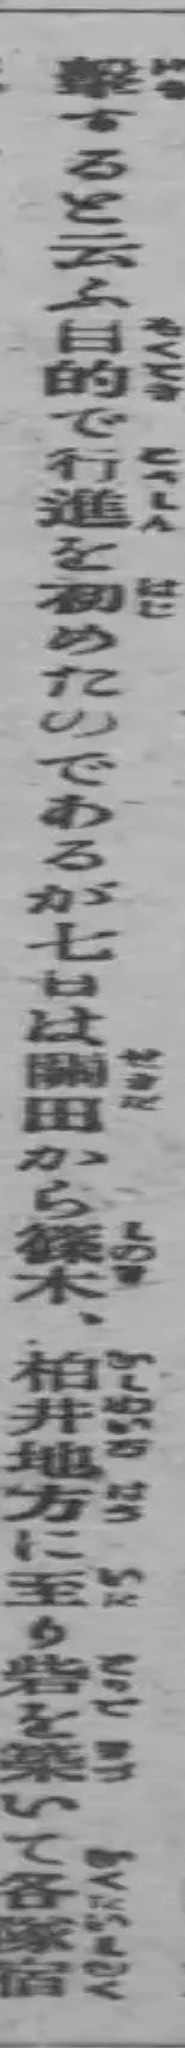篠木柏井撃すると云ふ目的で行進を初めたのであるが七日は関田から篠木、柏井地方に至り砦を築いて各隊宿
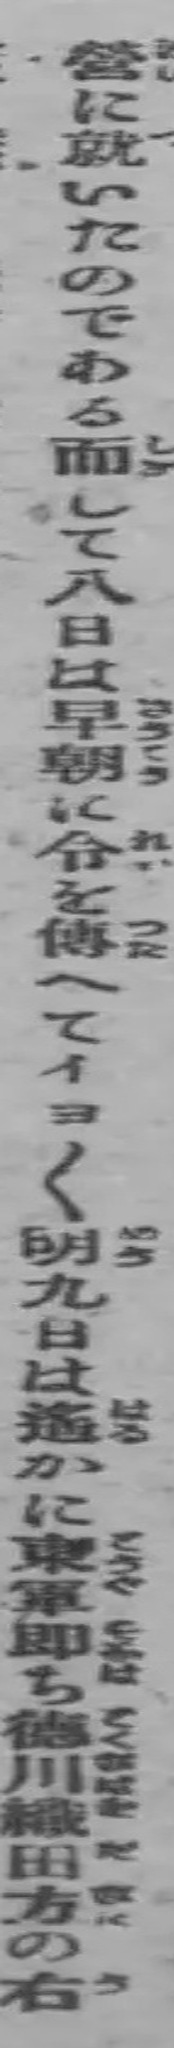営に就いたのである而して八日は早朝に令を伝へてイヨ〳〵明九日は遥かに東軍即ち徳川織田方の右
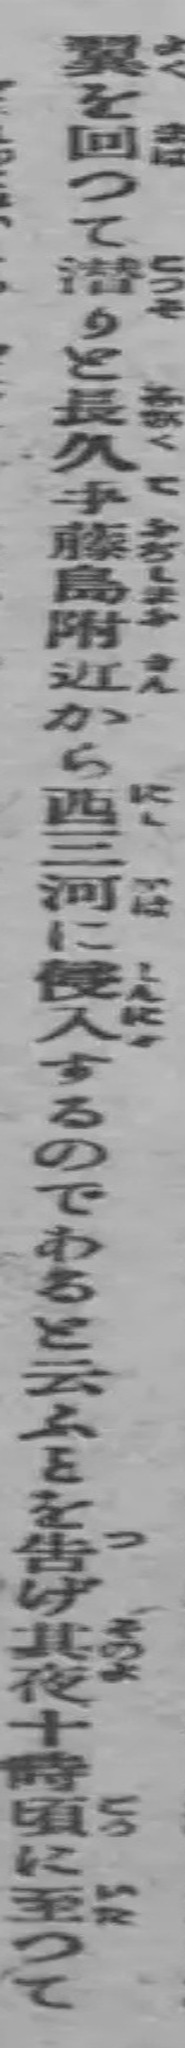翼を回つて潜りと長久手藤島附近から西三河に侵入するのであると云ふことを告げ其夜十時頃に至つて
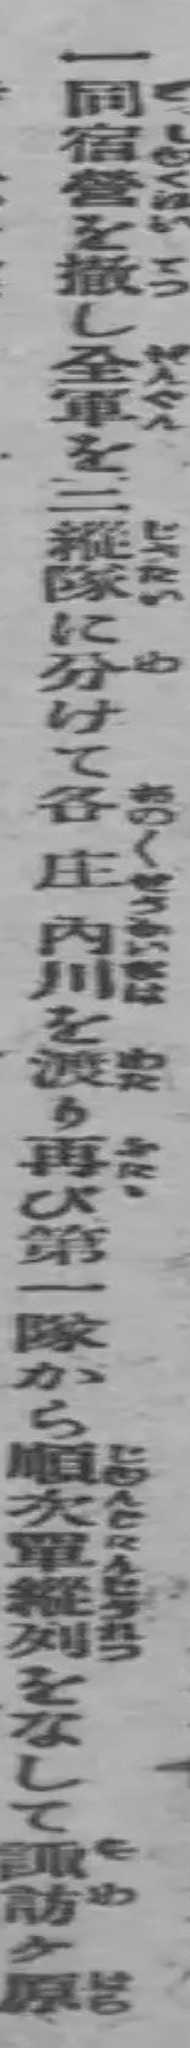一同宿営を撤し全軍を二縦隊に分けて各庄内川を渡り再び第一隊から順次単縦列をなして諏訪ケ原
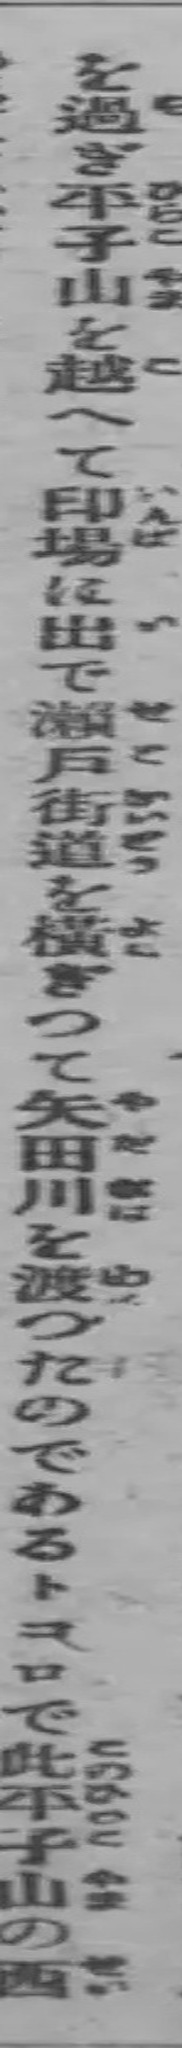を過ぎ平子山を越へて印場に出で瀬戸街道を横ぎつて矢田川を渡つたのであるトコロで此平子山の西
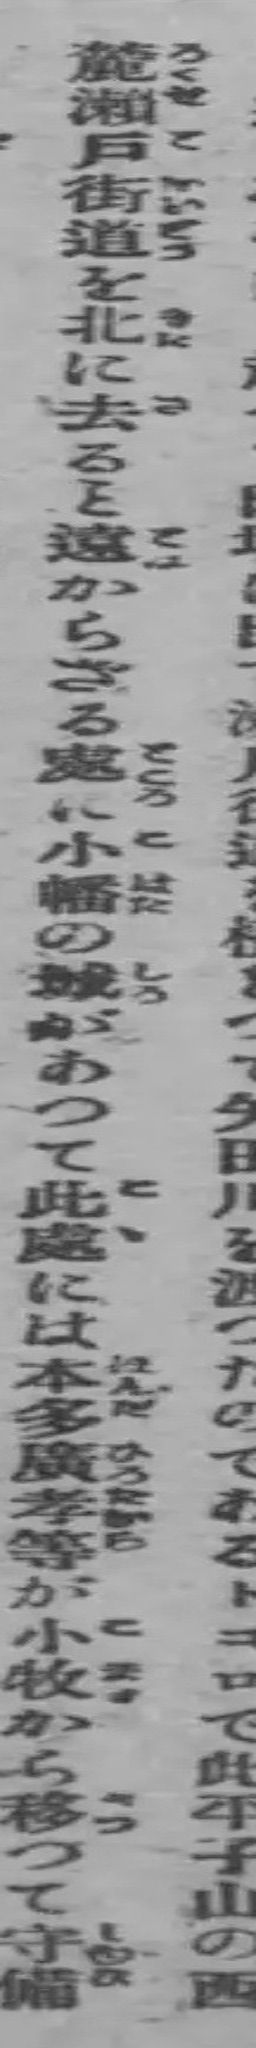木幡城麓瀬戸街道を北に去ること遠からざる処に小幡の城があつて此処には本多広孝等が小牧から移つて守備
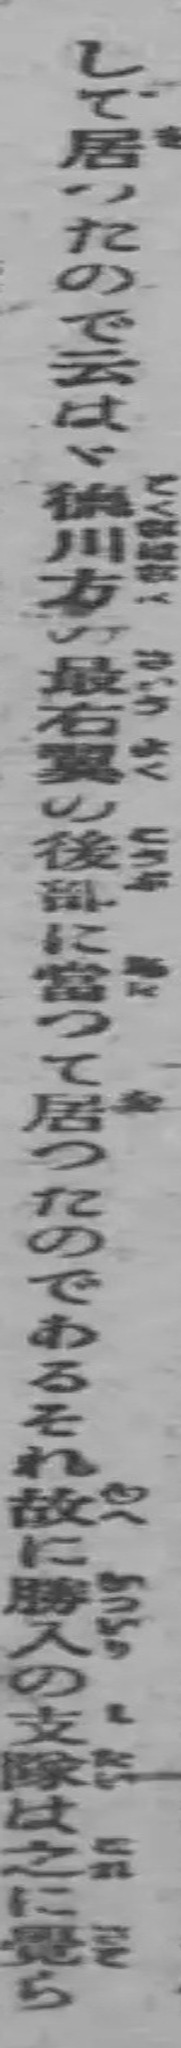して居つたので云はゞ徳川方の最右翼の後部に当つて居つたのであるそれ故に勝入の支隊は之に覚ら
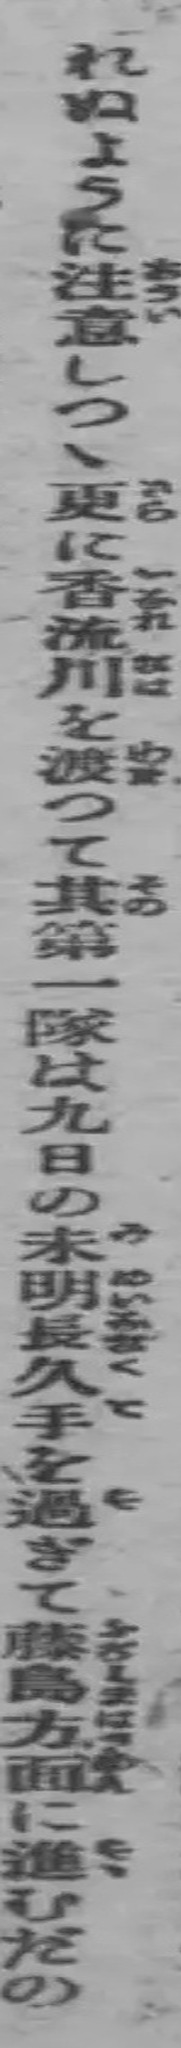れぬように注意しつゝ更に香流川を渡つて其第一隊は九日の未明長久手を過ぎて藤島方面に進むだの
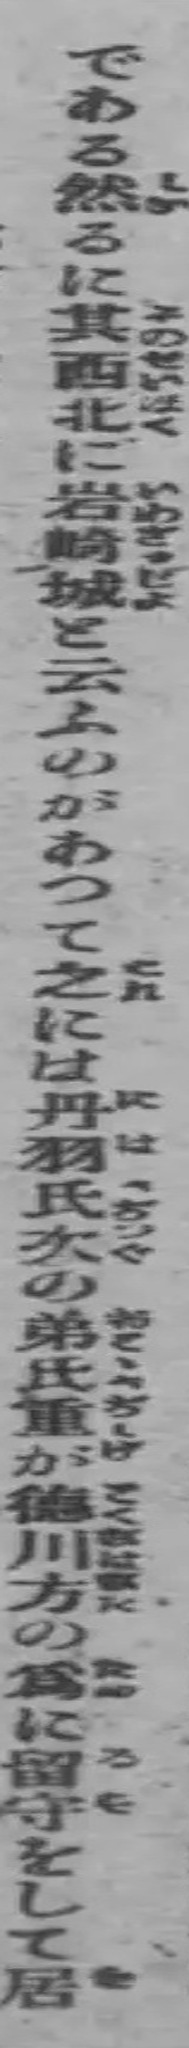岩崎城である然るに其西北に岩崎城と云ふのがあつて之には丹羽氏次の弟氏重が徳川方の為に留守をして居
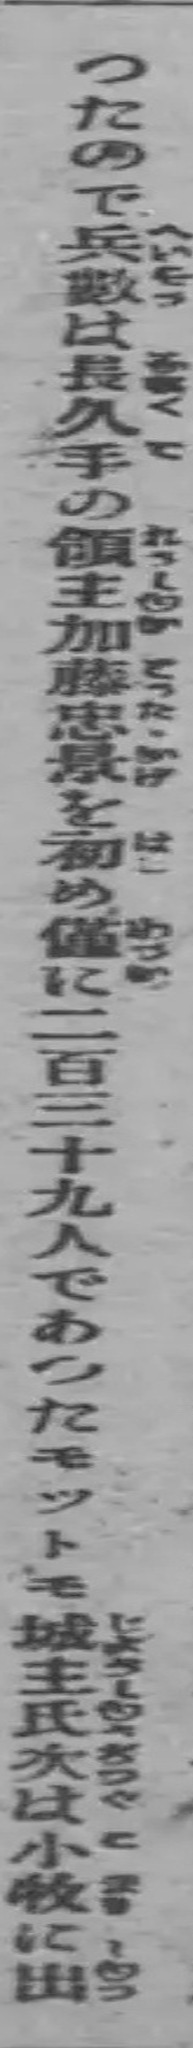つたので兵数は長久手の領主加藤忠景を初め僅に二百三十九人であつたモツトモ城主氏次は小牧に出
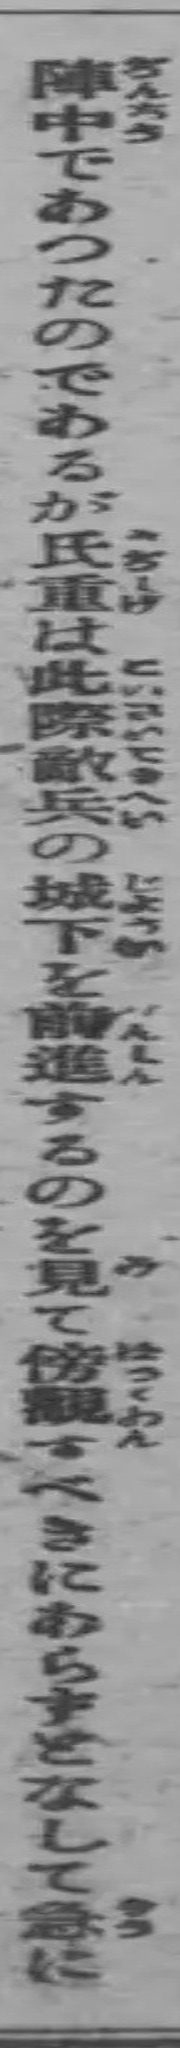陣中であつたのであるが氏重は此際敵兵の城下を前進するのを見て傍観すべきにあらずとなして急に
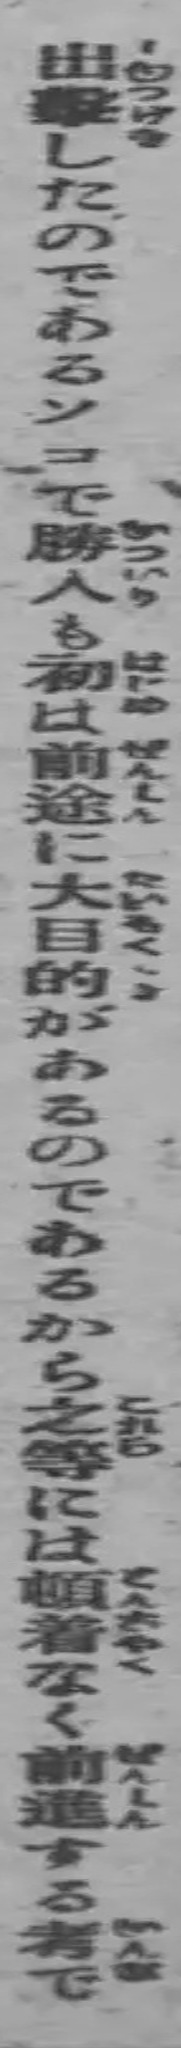出撃したのであるソコで勝入も初は前途に大目的があるのであるから之等には頓着なく前進する考で
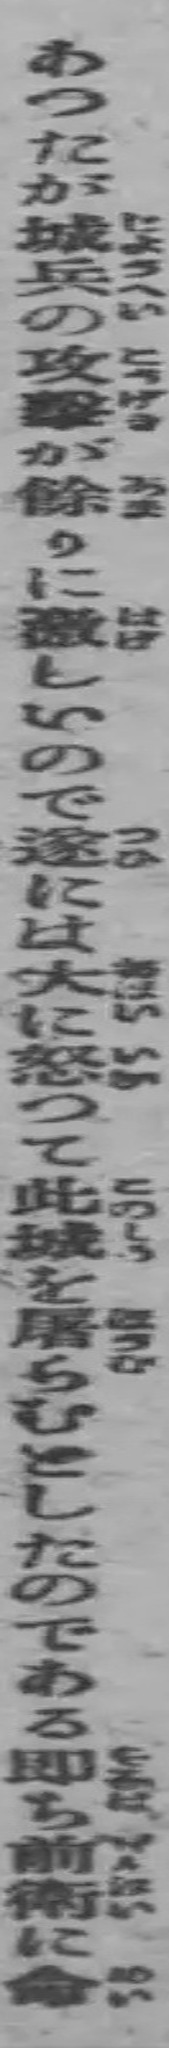あつたが城兵の攻撃が余りに激しいので遂には大に怒つて此城を屠らむとしたのである即ち前衛に命
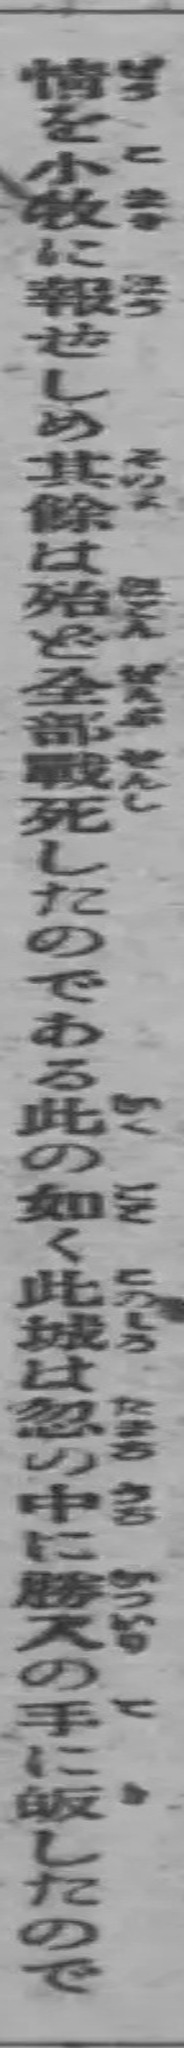情を小牧に報ぜしめ其余は殆ど全部戦死したのである此の如く此城は忽の中に勝入の手に皈したので
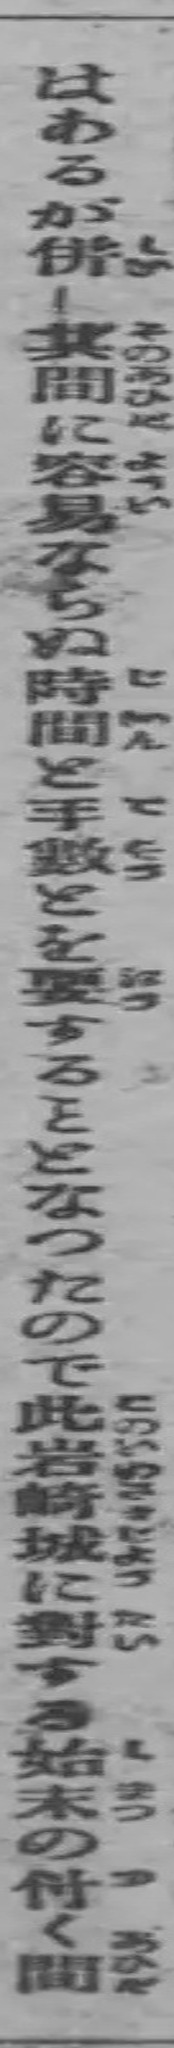はあるが併し其間に容易ならぬ時間と手数とを要することとなつたので此岩崎城に対する始末の付く間
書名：豊橋市史談
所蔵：国立国会図書館 National Diet Library, JAPAN
